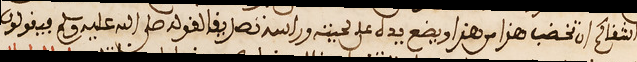اشقاكم ان تخضب هذا نت هذا ويضع يده على لحيته وراسه تصديقا لقوله صلى الله عليه وسلم فيقولون
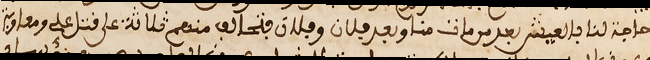حاجة لنا بالعيش بعد من مات منا وبعد فلان وفلان فتحالف منهم ثلاثة على قتل على ومعاوية
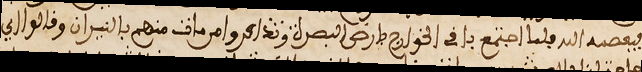فيعصمه الله فلما اجتمع باقى الخوارج بارض البصرة وتذاكروا من مات منهم بالنيران وقالوا اي
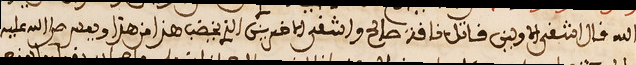الله قال اشقى الاولين قاتل ناقة صالح واشقى الاخرين الذي يخضب هذا من هذا ويمس صلى الله عليه
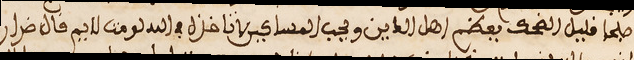صفحا قليل الضحك يعظم اهل الدين ويحب المساكين لا تاخذه في الله لومت لايم قال ضرار
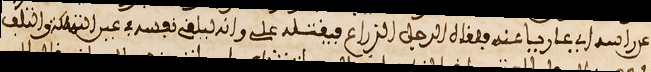عن راسه اي عاريا عنه فلقاه الرجل الذراع فيقتله على انه ليلقى نفسه في عين التهلكة والتلف
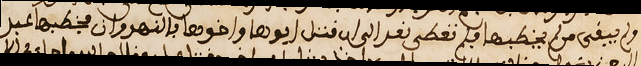ولم يبقى من لم يخطبها فلم تعطى بعد الى ان قتل ابوها واخوها بالنهروان فخطبها عبد
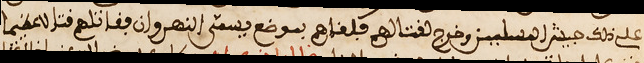على ذلك جيش المسلمين وخرج لقتالهم فلقاهم بموضع يسمى النهروان فقاتلهم قتالا عظيما
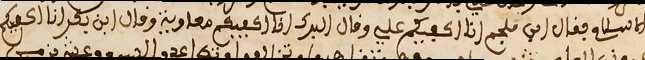الاسلام فقال ابن ملجم انا اكفيكم علي وقال البرك انا اكفيكم معاوية وقال ابن بكر انا اكفيكم
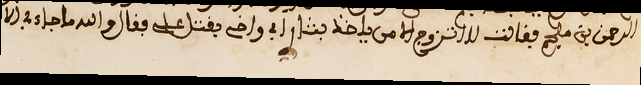الرحمن بن ملجم فقالت لا اتزوج الا من ياخذ بثار ابى واخى بقتل على فقال والله ما جاء في الا
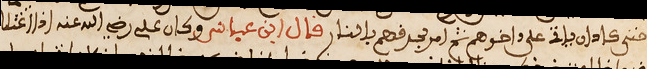حتى كاد ان ياتى على ءاخرهم ثم امر بحرقهم بالنار قال ابن عباس وكان على رضي الله عنه اذا اعتلا
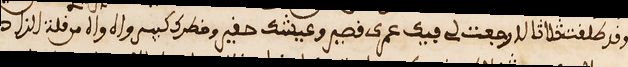وقد طلقت ثلاثا لا رجعت لى فيك عمرك قصير وعيشك حقير وخطرك كبير واه واه من قلة الزاد
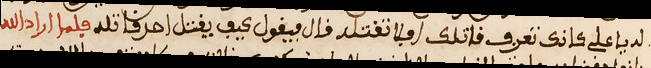له يا على كانك تعرف قاتلك افلا تقتله قال فيقول كيف يقتل احد قاتله فلما اراد الله
